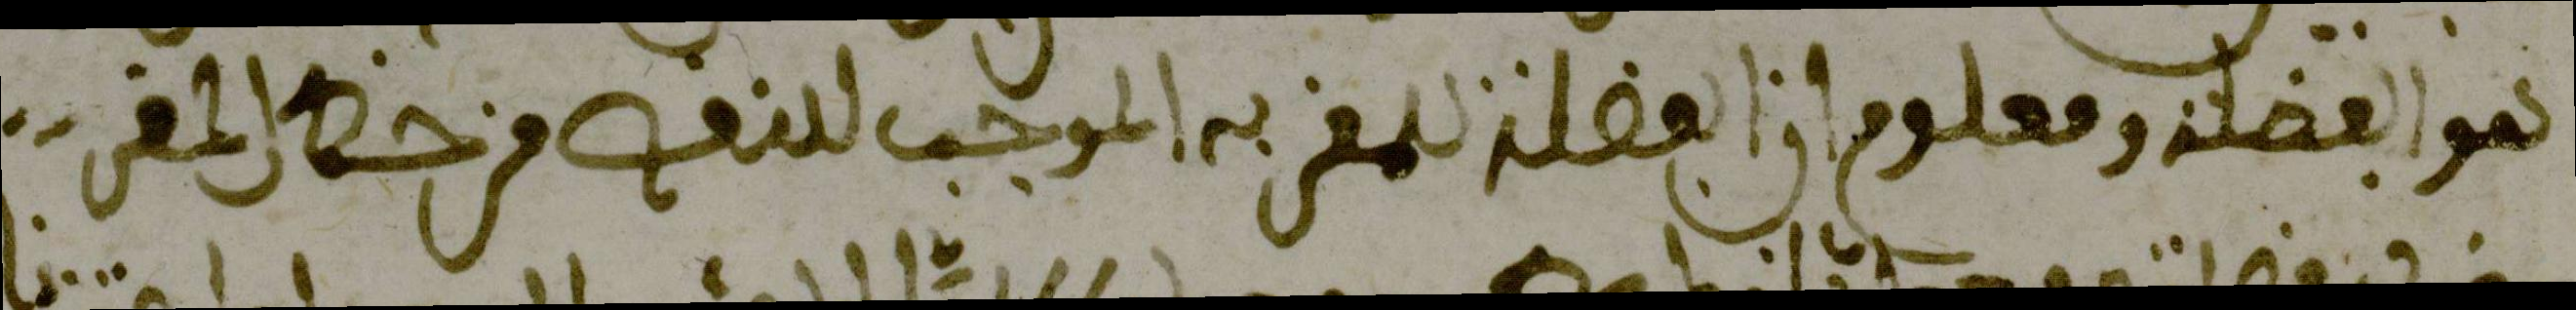هو الفضلة ومعلوم ان الفضلة للمقر به الموجب للنقص من حظ المقر
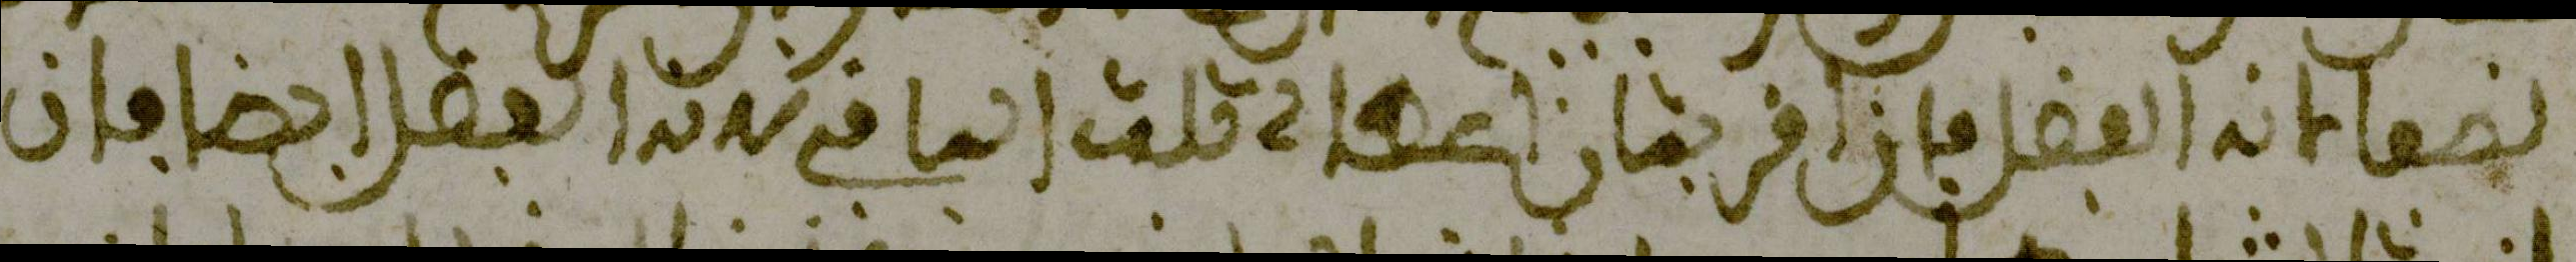نصفا لانه الفضل فان اقر بثان اعطاه ثلث الباقي لانه الفضل ايضا فان
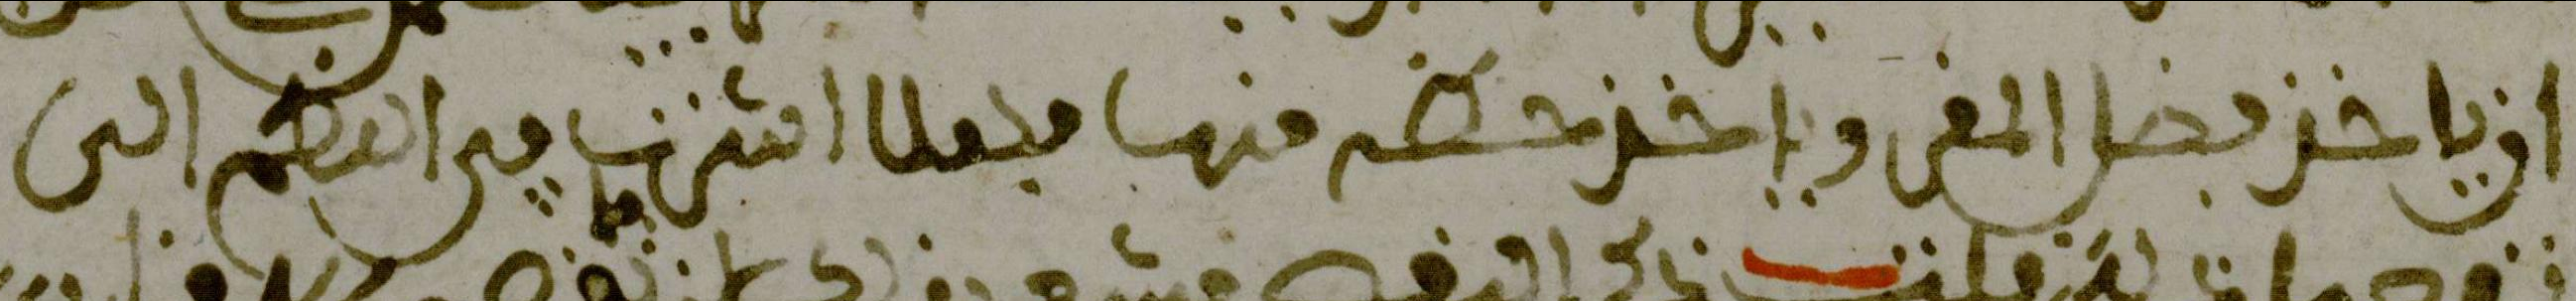ان ياخر فضل المقر وياخذ حظه منها فهلا اشرت في النظم الى
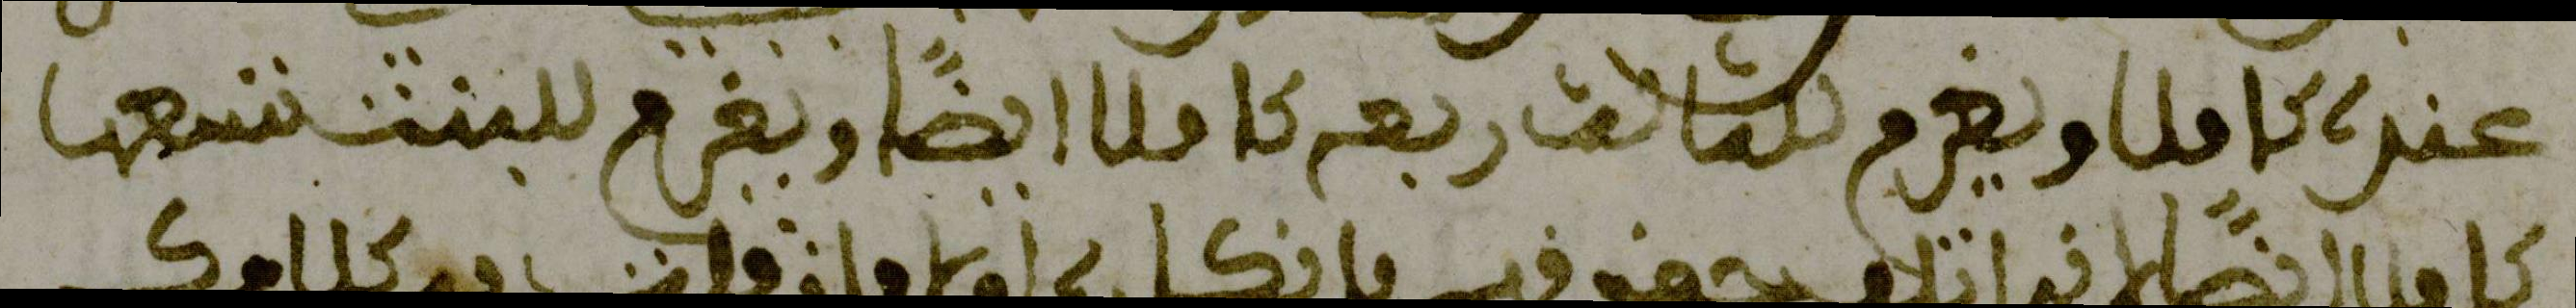عنده كاملا ويغرم للثالث ربعه كاملا ايضًا ويغرم للبنت تسعها
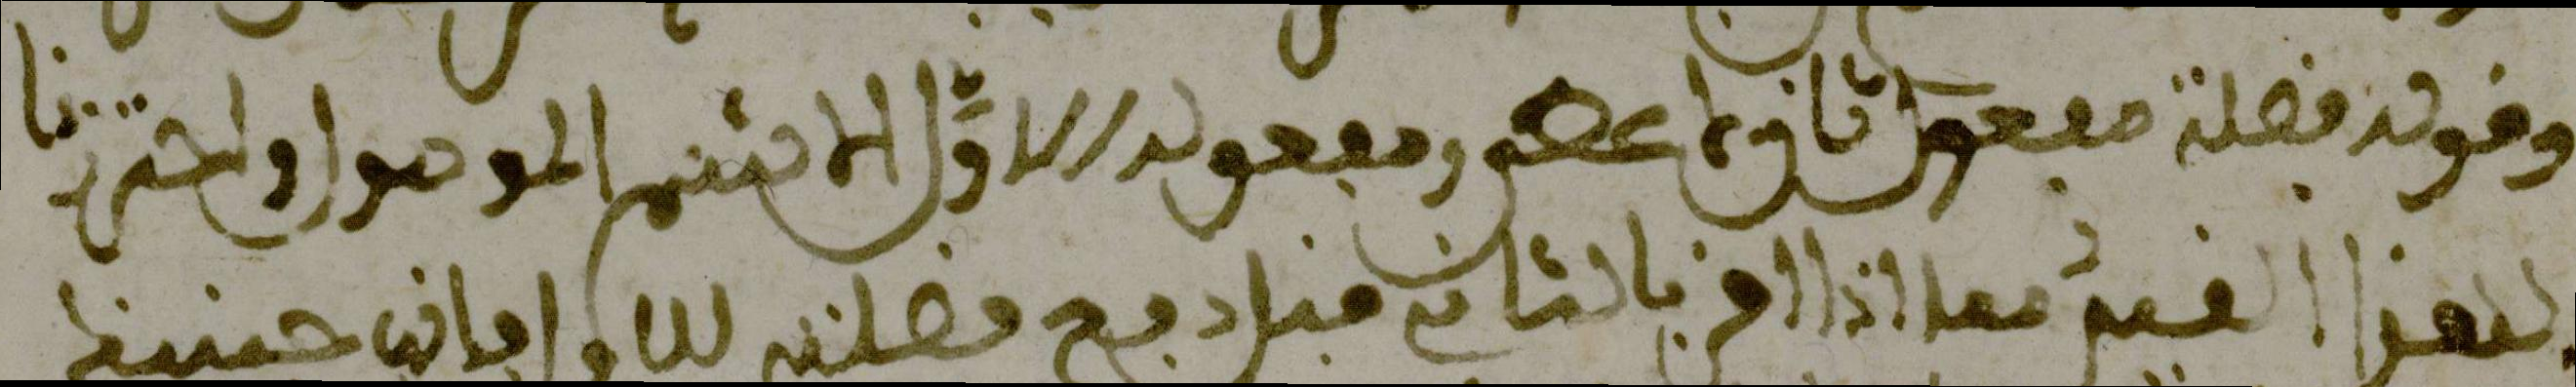وقوله فضلة معلوم ثان لاعطي ومفعول الاوَّل الاسْم الموصول واحترزنا
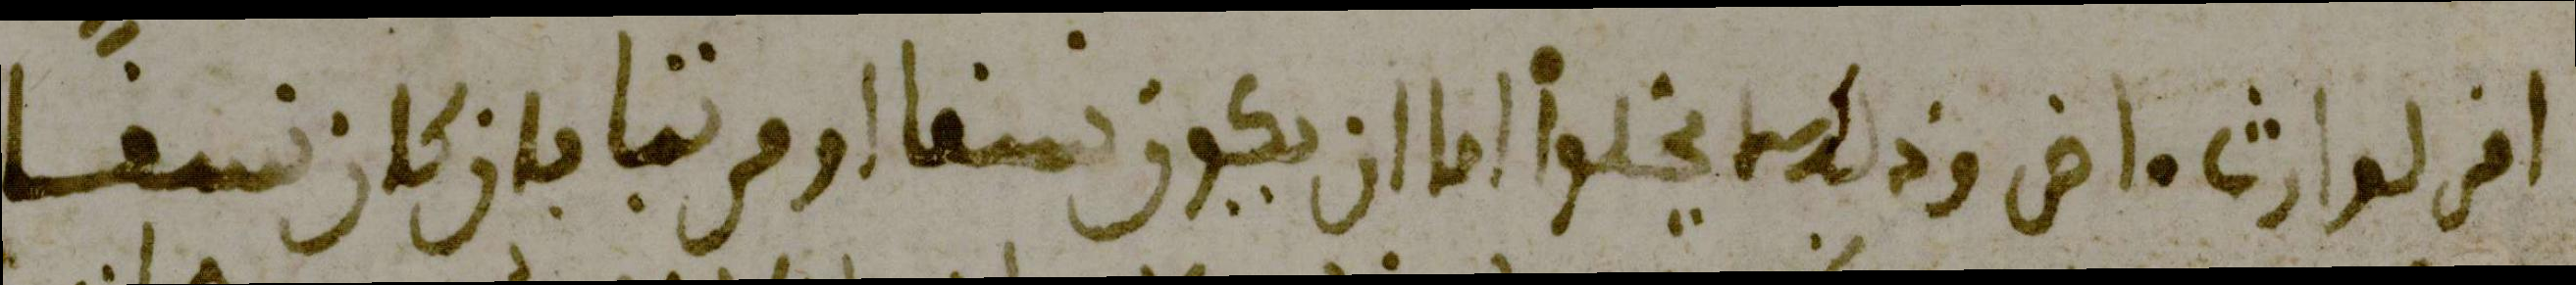اقر لوارث ءاخر وذلك لا يخلوا ما ان يكون نسقا او مرتبا فان كان نسقًا
